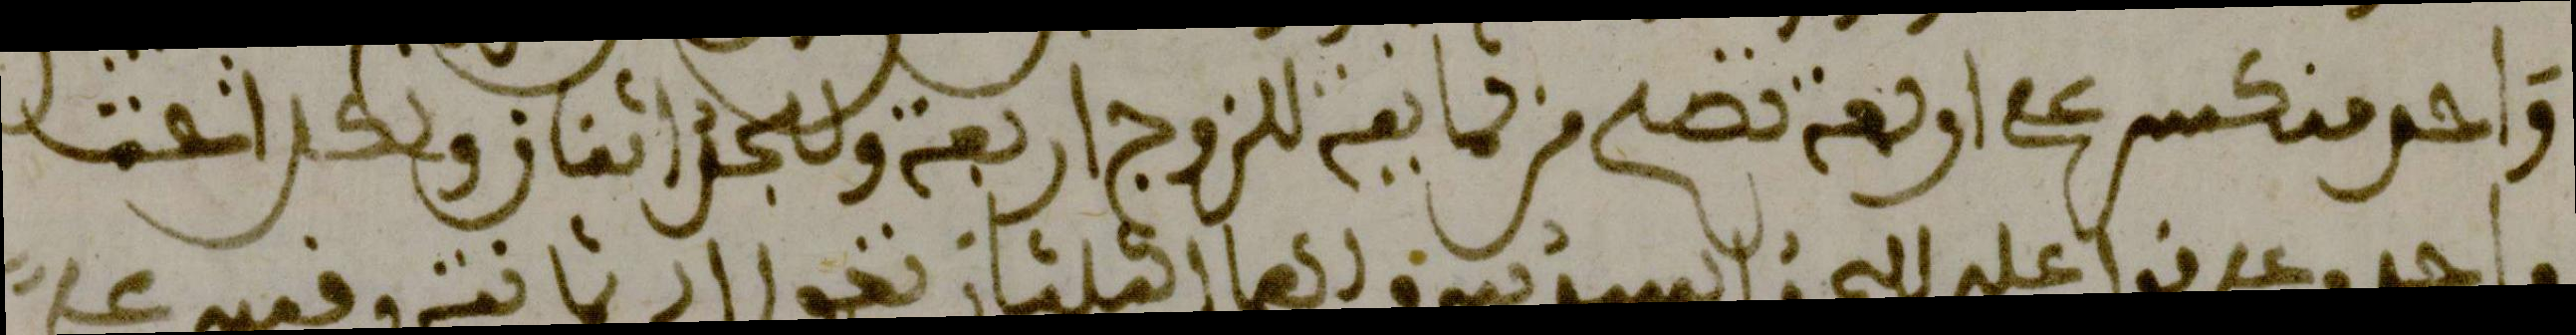وَاحد منكسر على اربعة تصح من ثمانية للزوج اربعة وللجد اثنان ولكل اخت
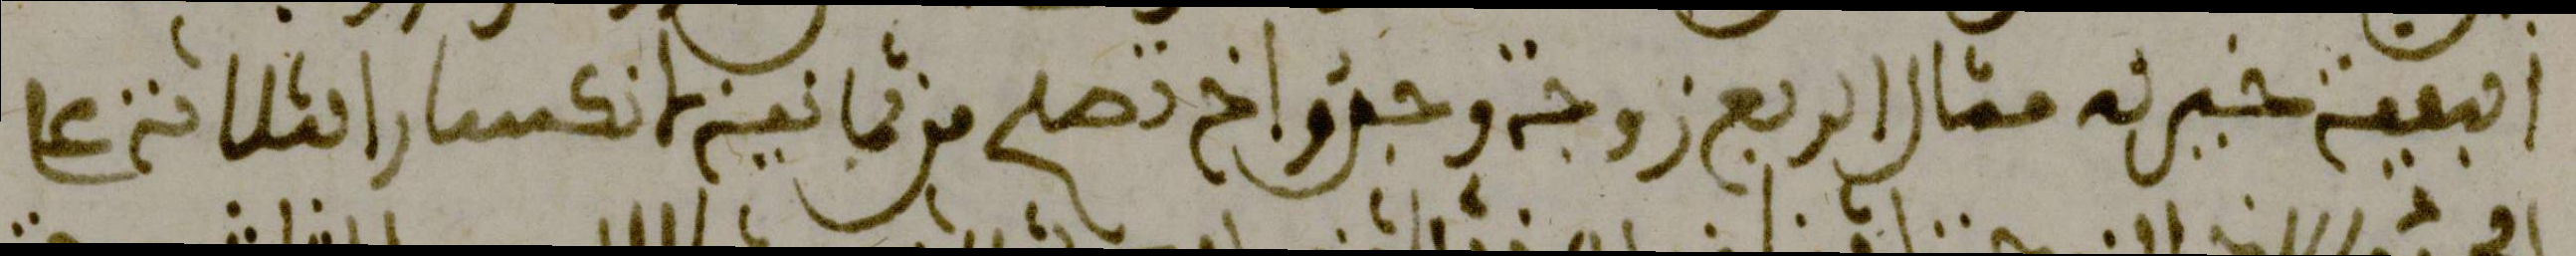البقية خير له مثال الربع زوجة وجد واخ تصح من ثمانية لانكسار الثلاثة على
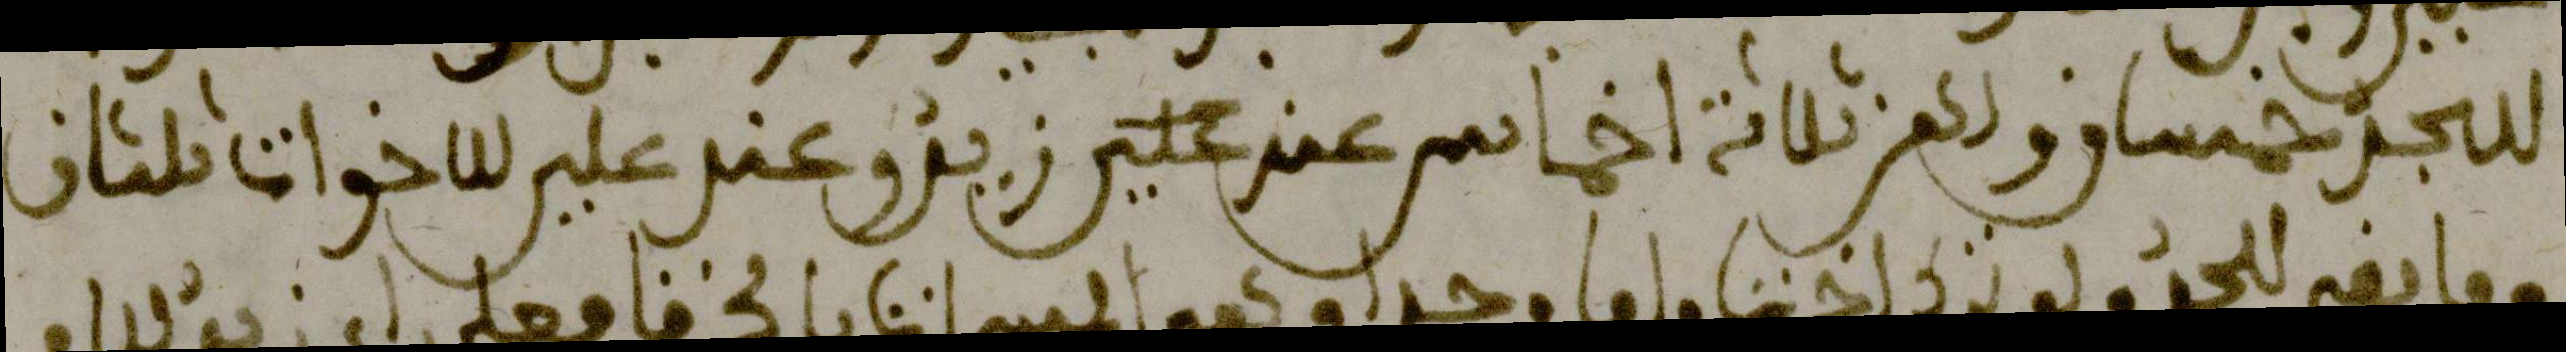للجد خمسان ولهن ثلاثة اخماس عند علي زيد وعند علي للاخوات ثلثان
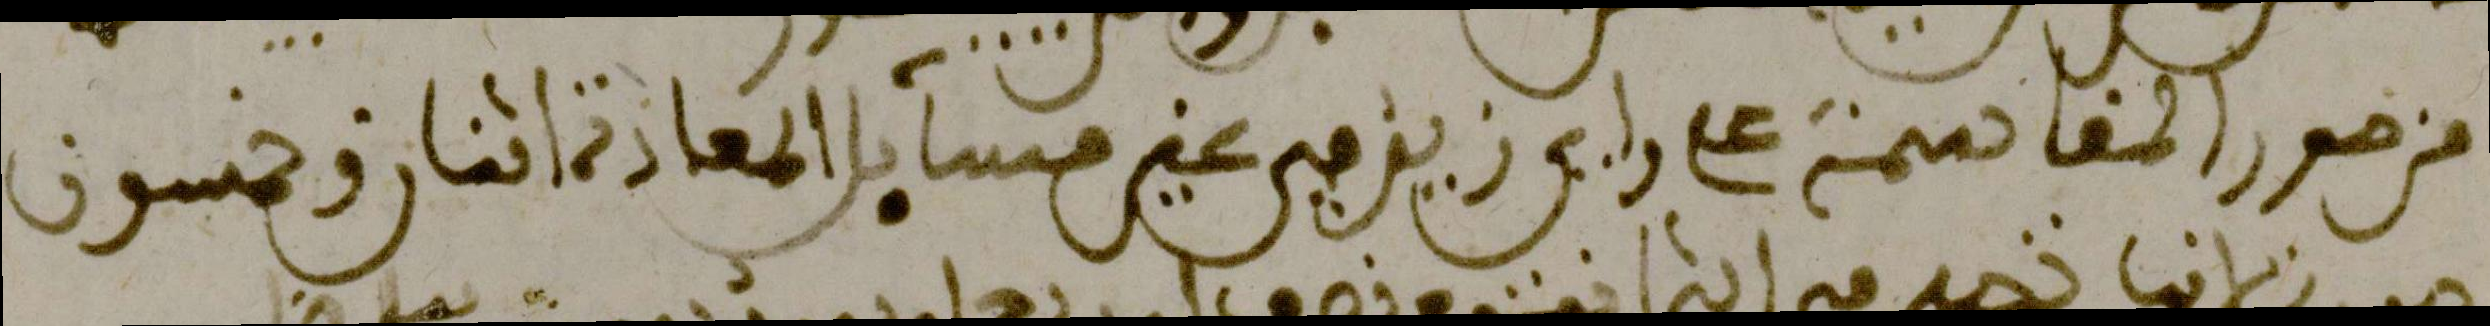من صور المقاسمة على راي زيد في غير مسائل المعادة اثنان وخمسون
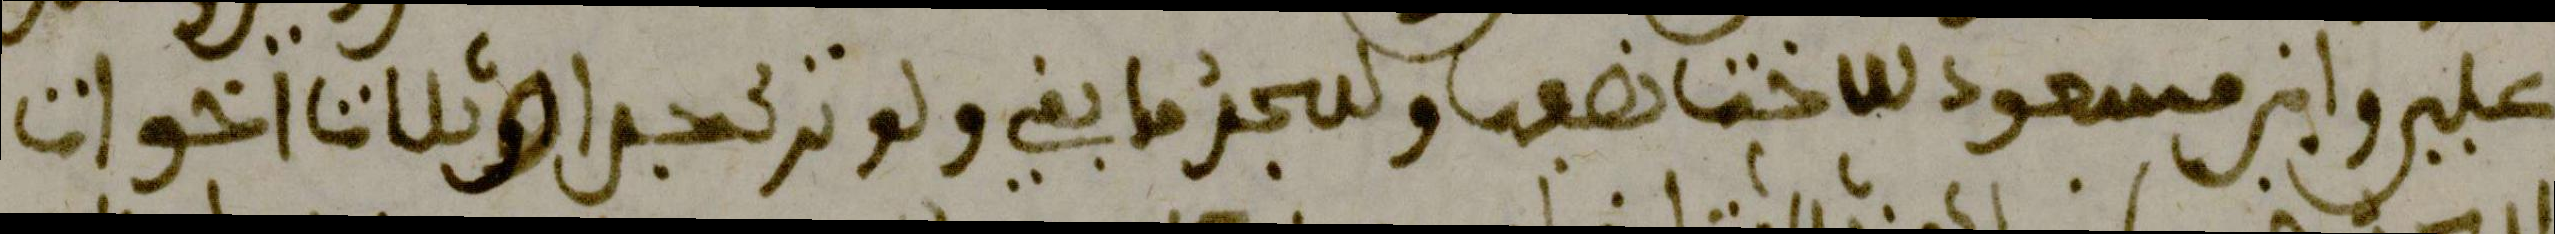علي وابن مسعود للاخت نصفها وللجد ما بقي ولو تركجدا وثلاث اخوات
